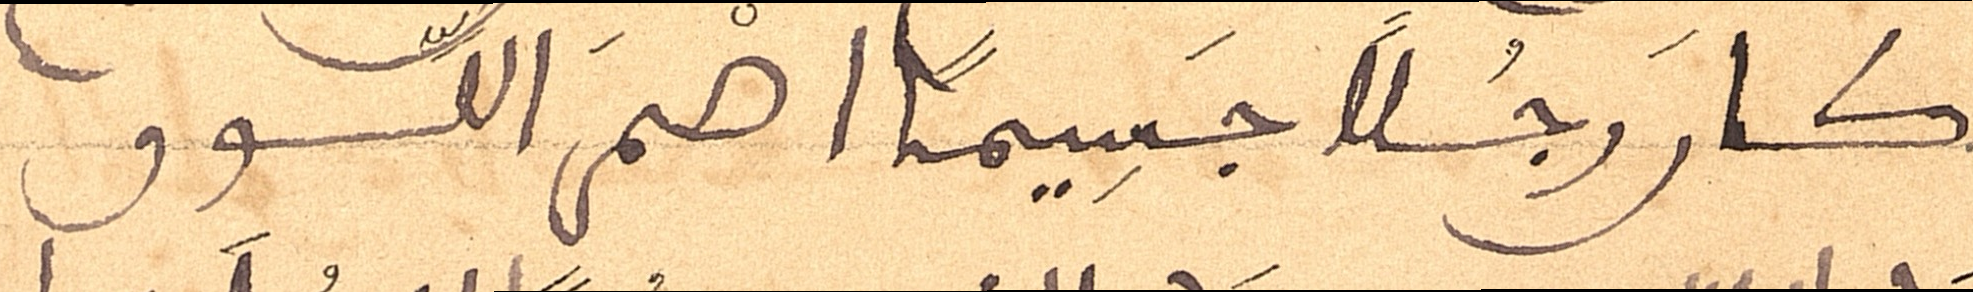كان رجلا جسيما اصمر اللون
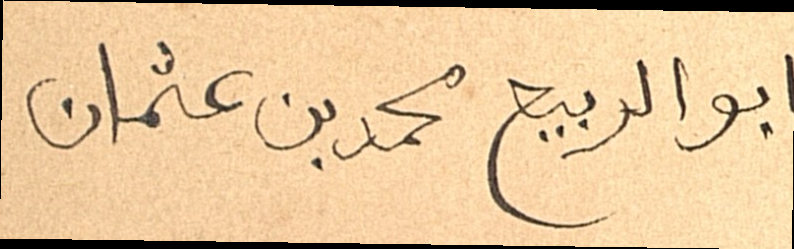ابو الربع محمد بن عثمان
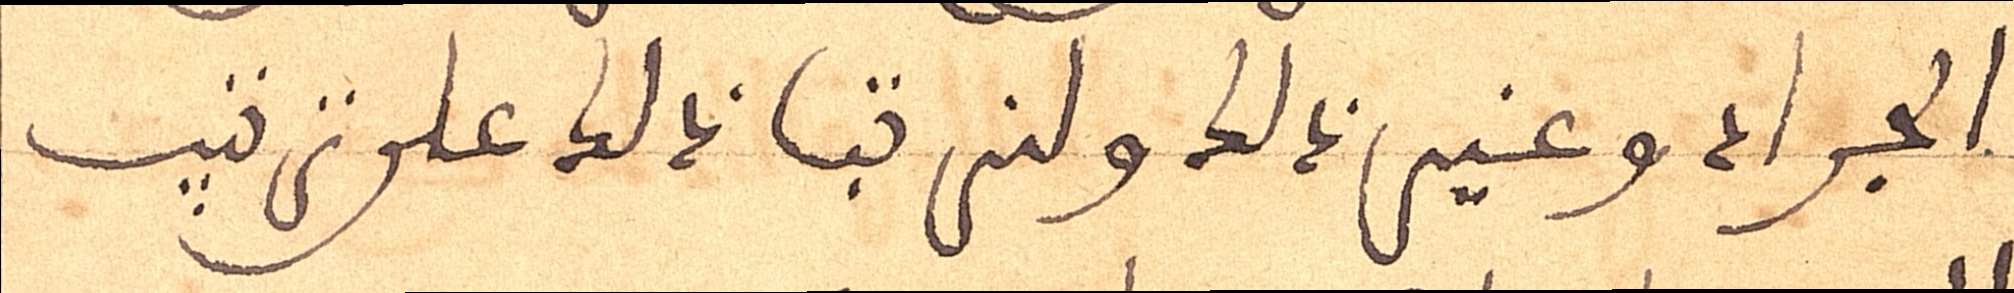الجراد وغير ذلك ولنرتب ذلك على ترتيب
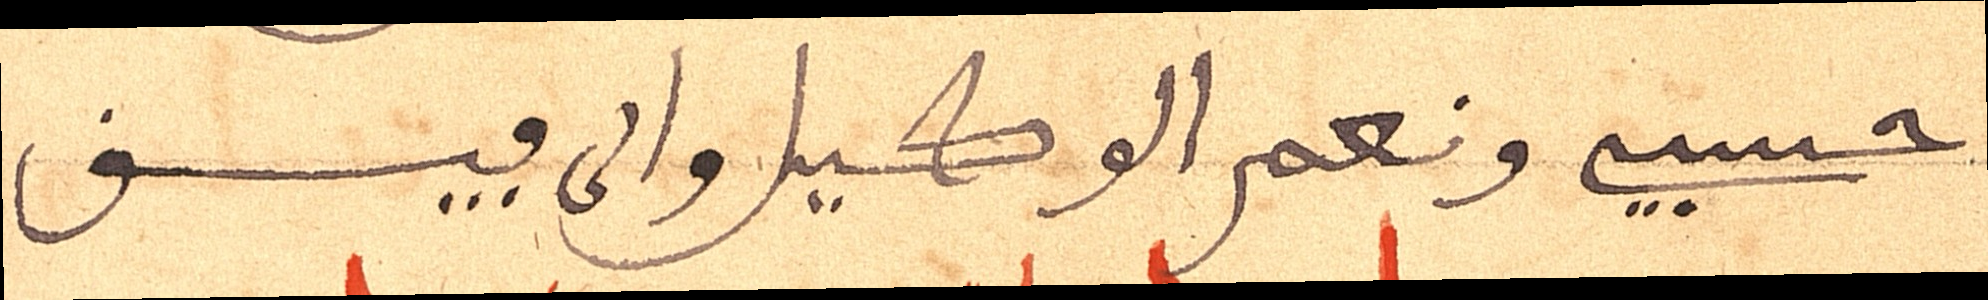حسبي ونعم الوكيل والى فيق
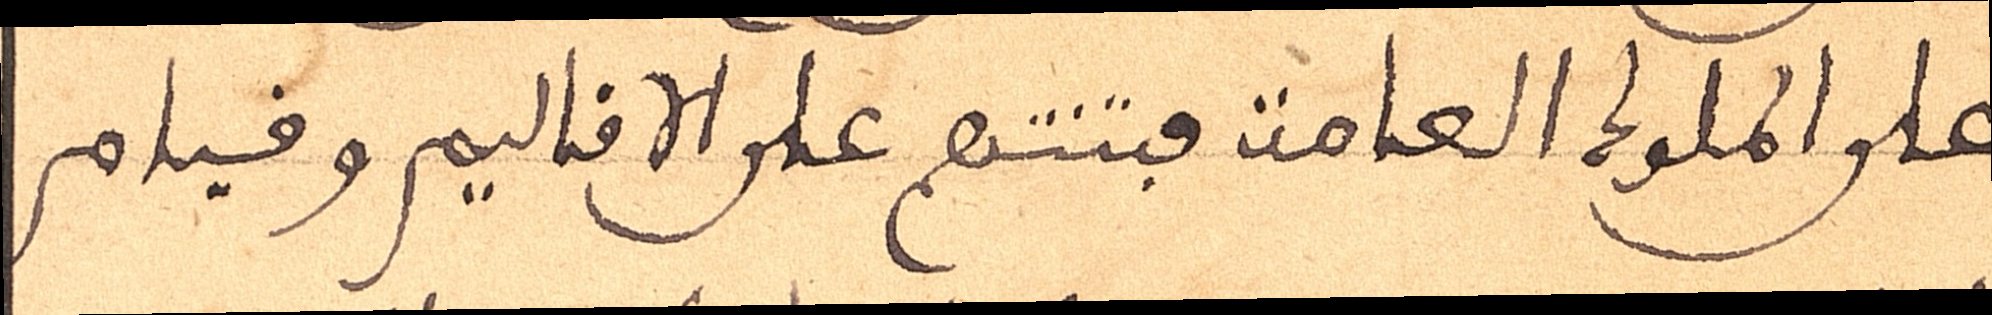على الملوك العامت فتنتهم على الاقاليم وقيام
